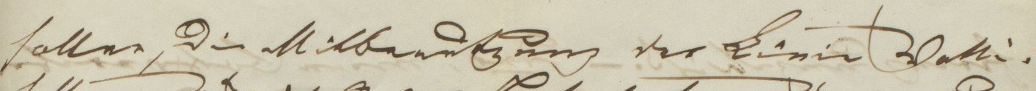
sollen, die Mitbenutzung der Linie Walli-
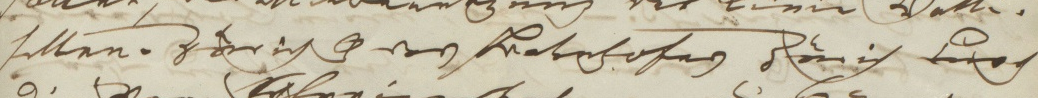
sellen–Zürich & des Bahnhofes Zürich durch
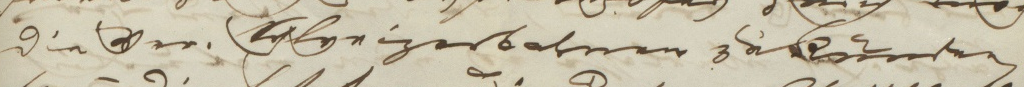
die Ver. Schweizerbahnen zu künden,
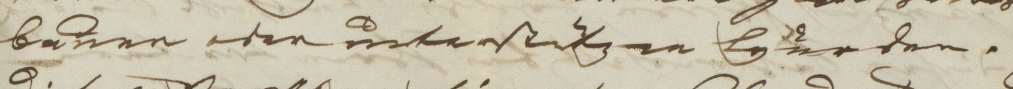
bauen oder unterstützen würden.
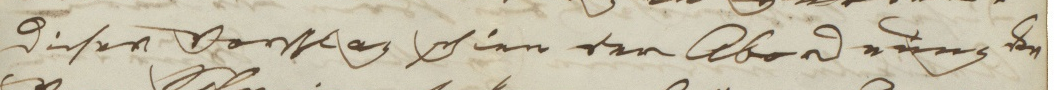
Dieser Vorschlag schien der Abordnung der
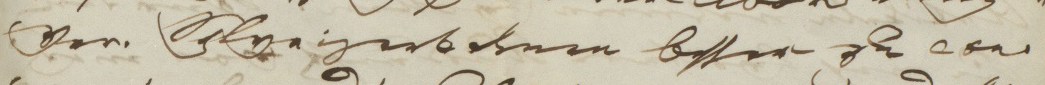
Ver. Schweizerbahnen besser zu con-
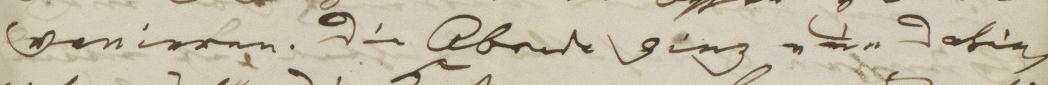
venieren. Die Abrede ging nun dahin,
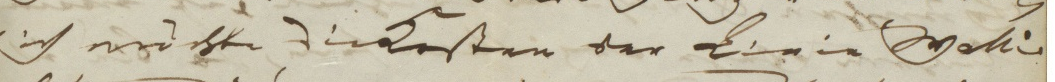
ich möchte die Kosten der Linie Walli-
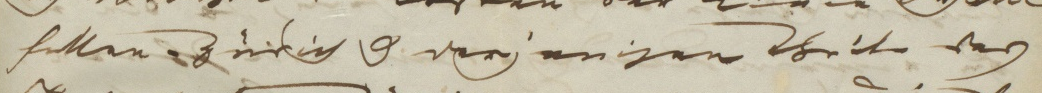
sellen–Zürich & derjenigen Theile des
